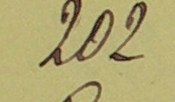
202
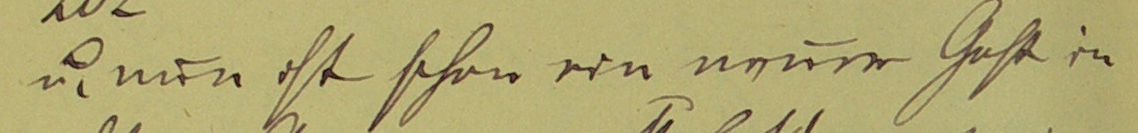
und nun ist schon ein neuer Gast in
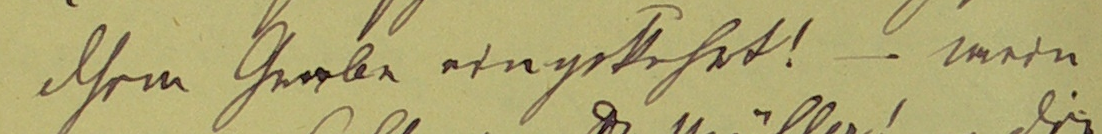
diesem Grab eingekehrt !- mein
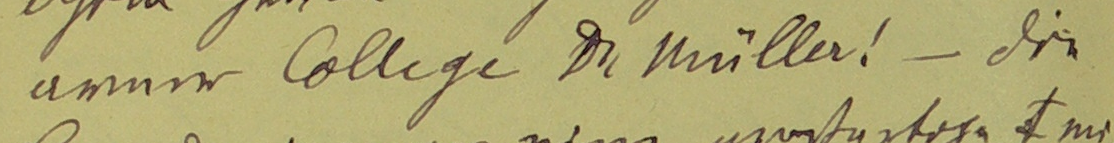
armer College Dr. Müller !- Die
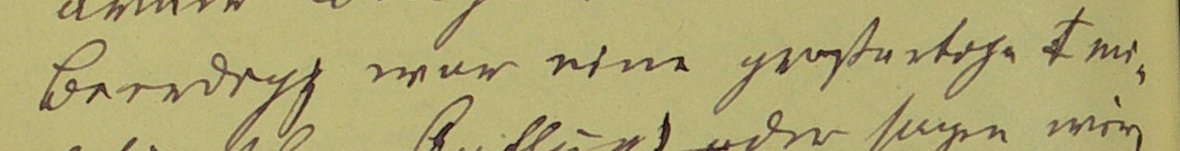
Beerdigung war eine großartige mit mi¬
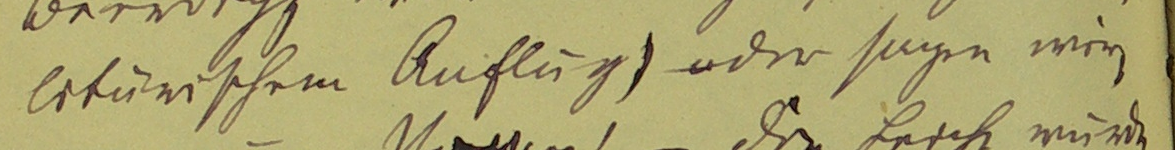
litärischem Anflug,- oder fangen wir
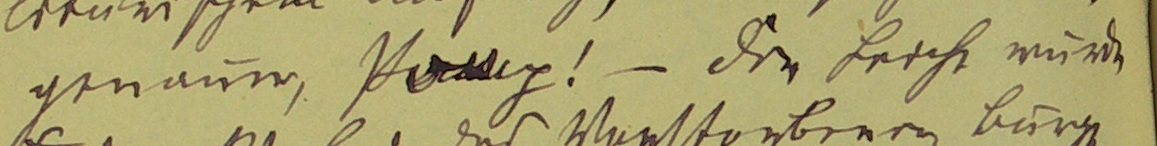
genau P omp ! -Die Leiche wurde
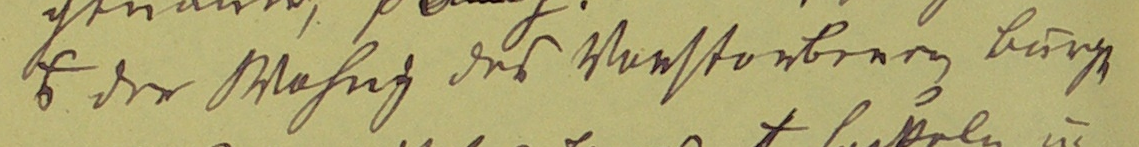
aus der Wohnung des Verstorbenen Burg¬
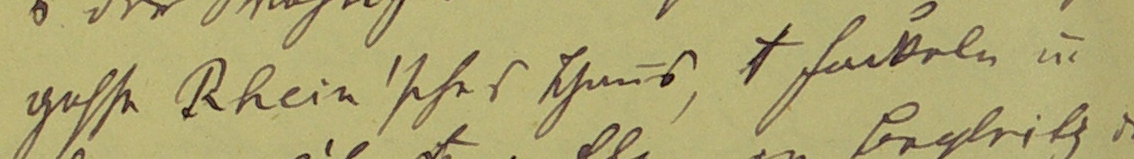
gasse Rhein’sches Haus, mit Fackeln und
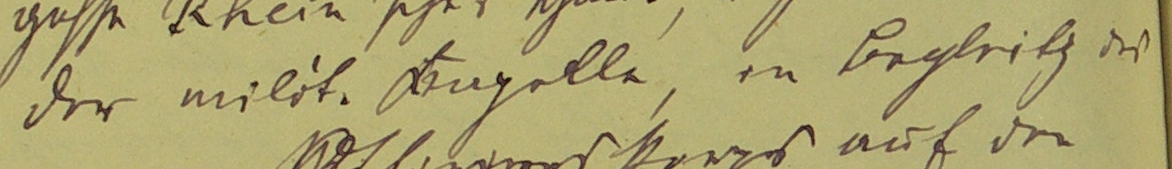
der militärischen Kapelle, in Begleitung des
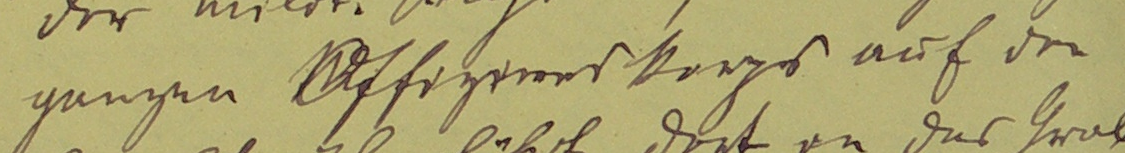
ganzen Offizierskorps auf den
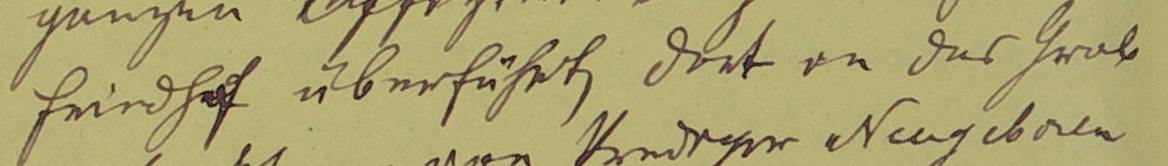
Friedhof überführt, dort in das Grab
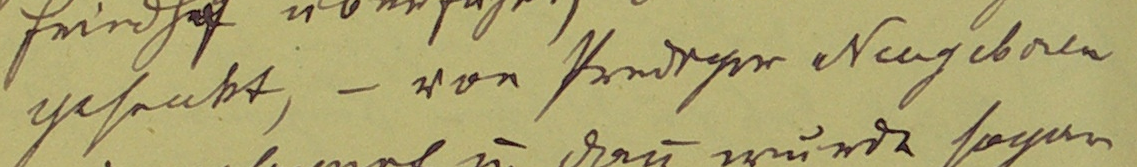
gesenkt,- von Prediger Neugeboren
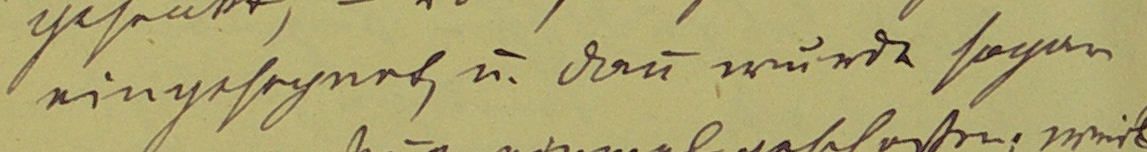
eingesegnet und dann wurde sogar
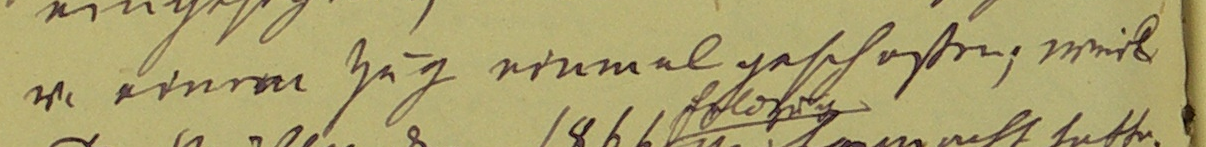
von einem Zug einmal geschosßen; weil
